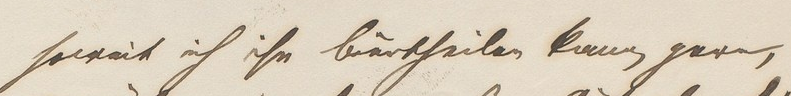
soweit ich ihn beurtheilen kann, gern,
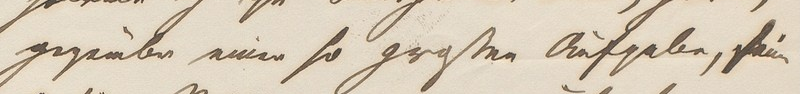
gegenüber einer so großen Aufgabe, seine
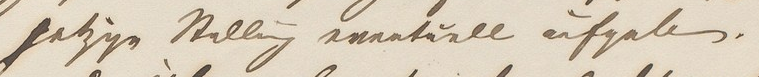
jetzige Stellung eventuell aufgeben.
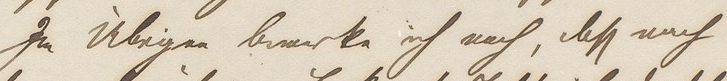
Zu Übrigen bemerke ich noch, dass nach
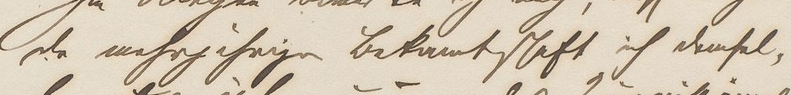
der mehrjärigen Bekanntschaft ich demsel-
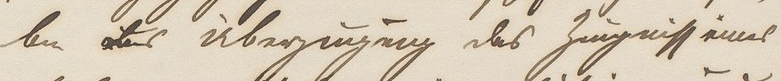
ben aus Überzeugung das Zeugniss eines
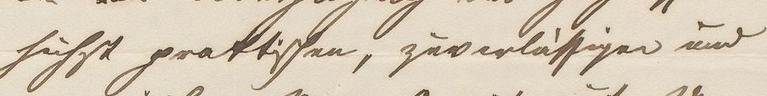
höchst praktischen, zuverlässigen und
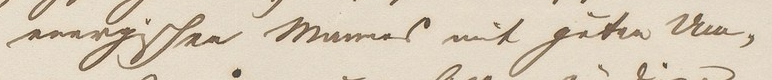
energischen Mannes mit guten Um-
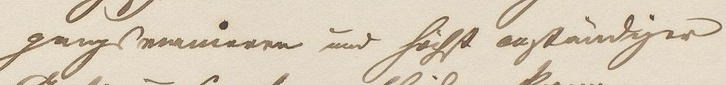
gangsmanieren und höchst anständiger
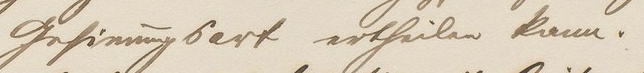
Gesinnungsart ertheilen kann.
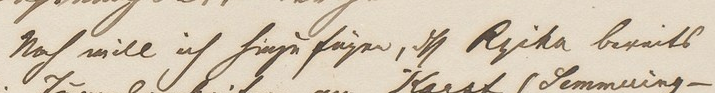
Noch will ich hinzufügen, dass Rziha bereits
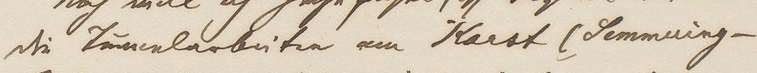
die Tunnelarbeiten am Karst (Semmering -
